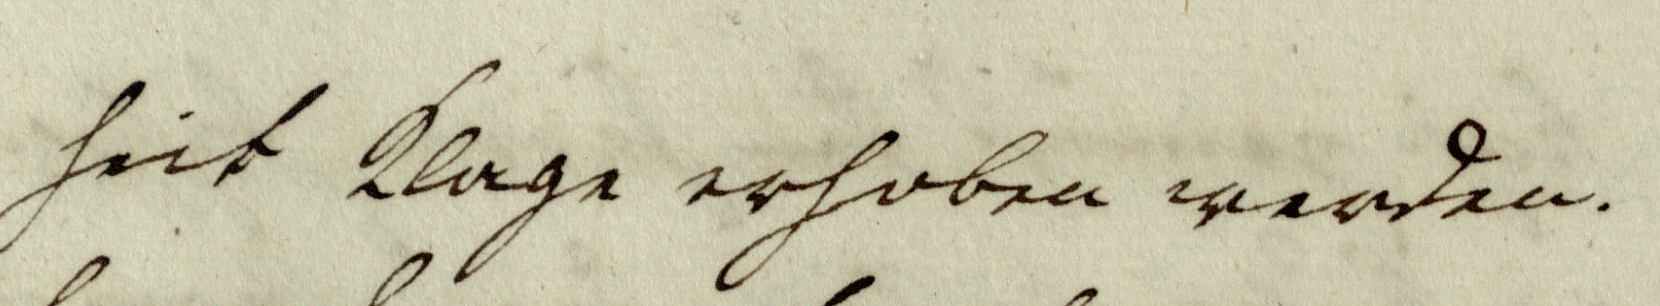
heit Klage erhoben werden.
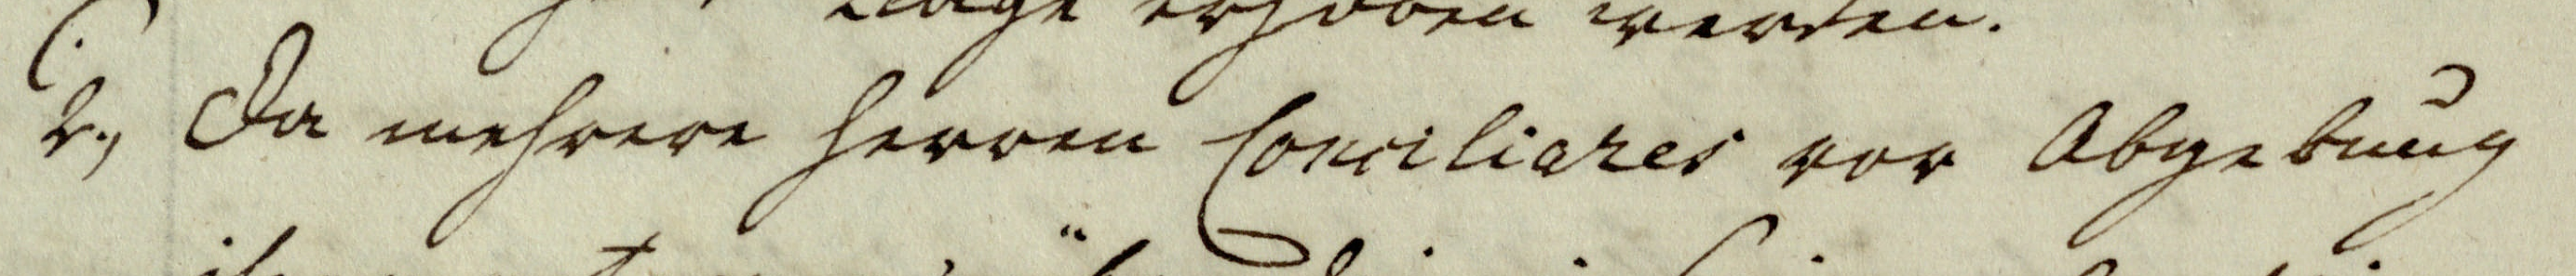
2., Da mehrere Herren Conciliares vor Abgebng
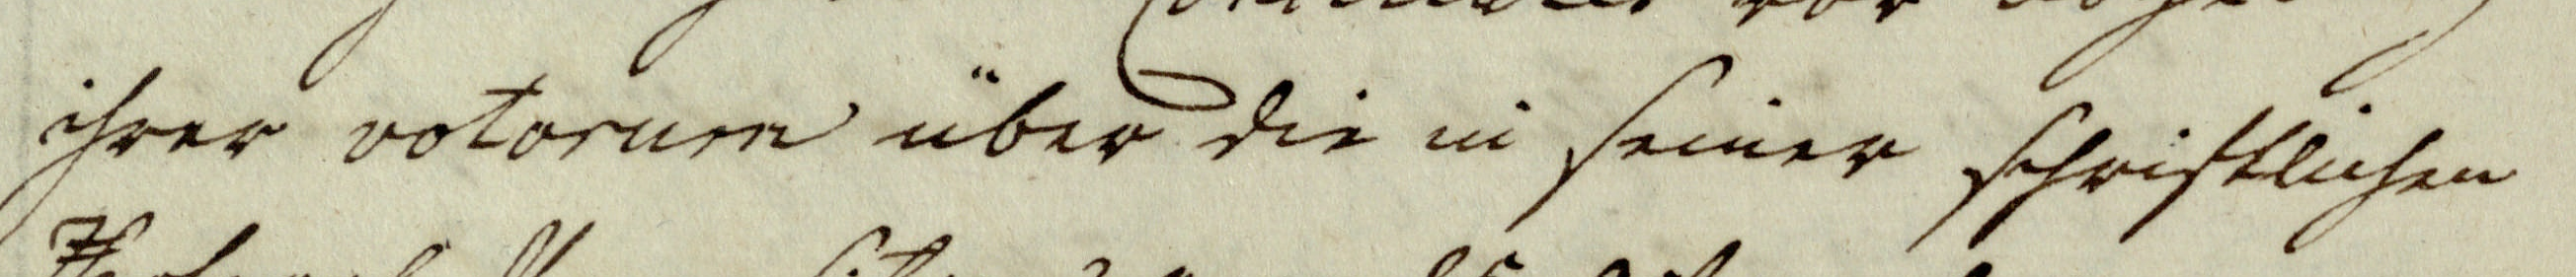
ihrer votorum über die in seiner schriftlichen
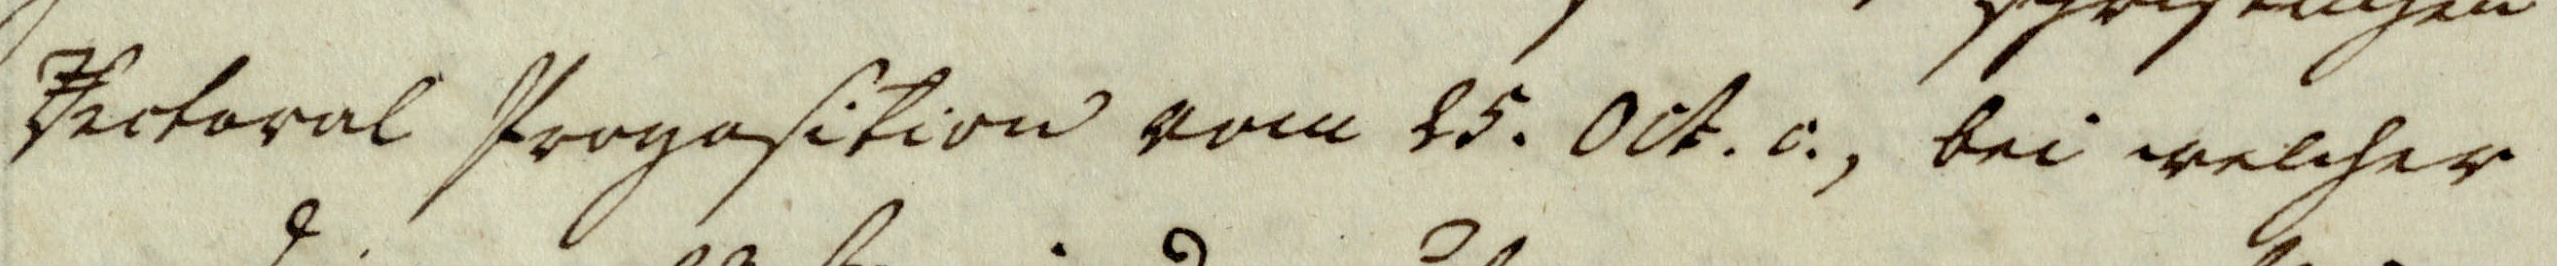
Rectoral Proposition vom 25. Oct. c., bei welcher
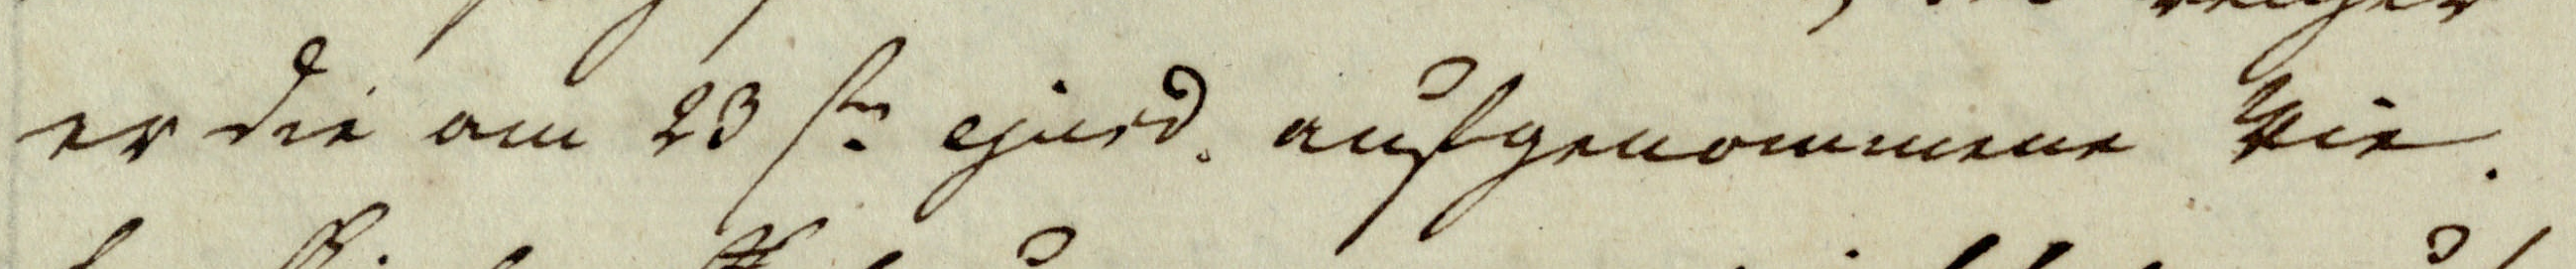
er die am 23 sten ejusd. aufgenommene Wie¬
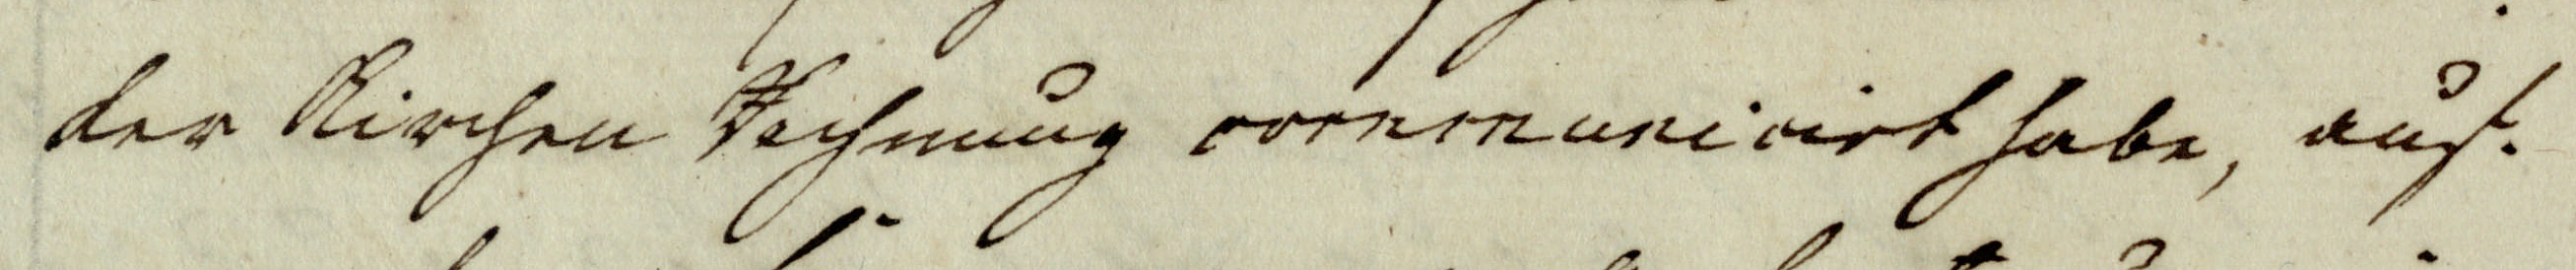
ker Kirchen Rechnung communicirt habe, auf¬
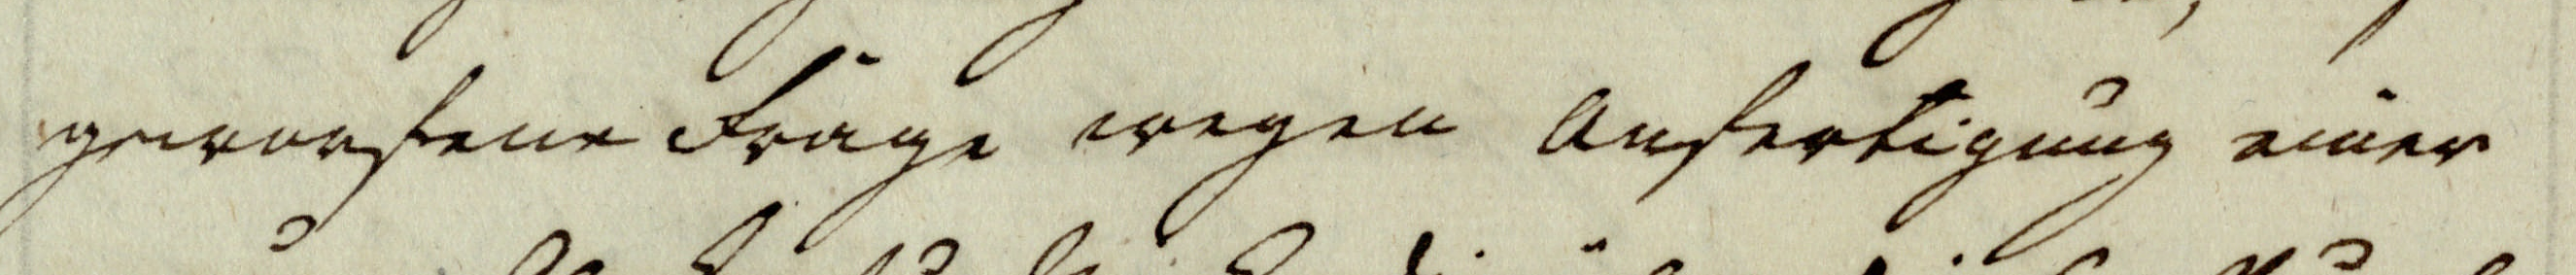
geworfene Frage wegen Anfertigung einer
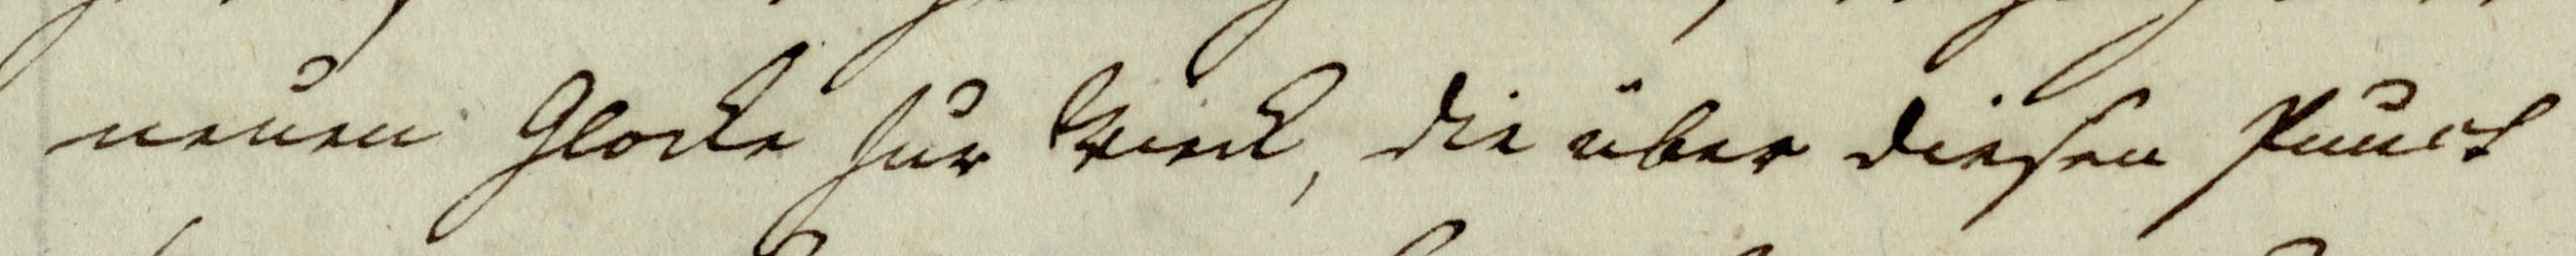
neuen Glocke zu Wieck, die über diesen Punct
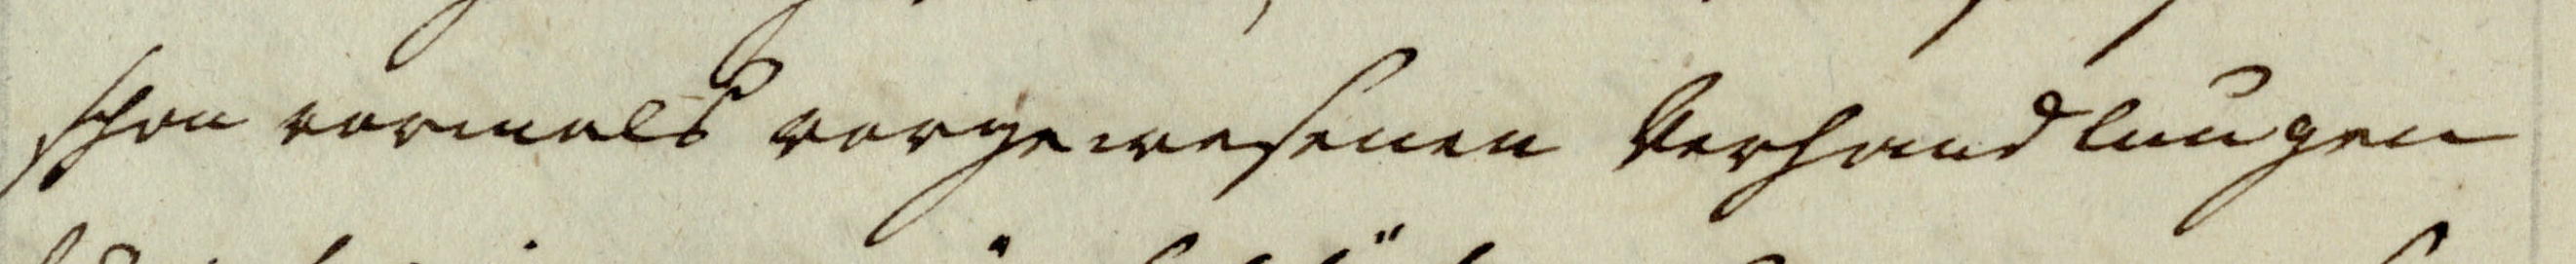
schon vormals vorgewesenen Verhandlungen
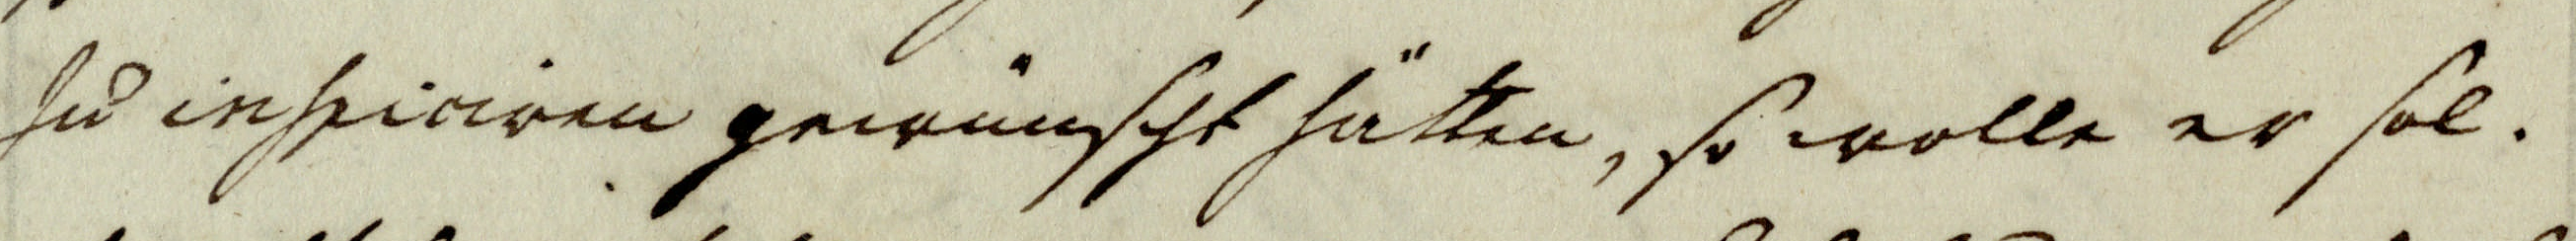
zu inspiciren gewünscht hätten, so wolle er sol¬
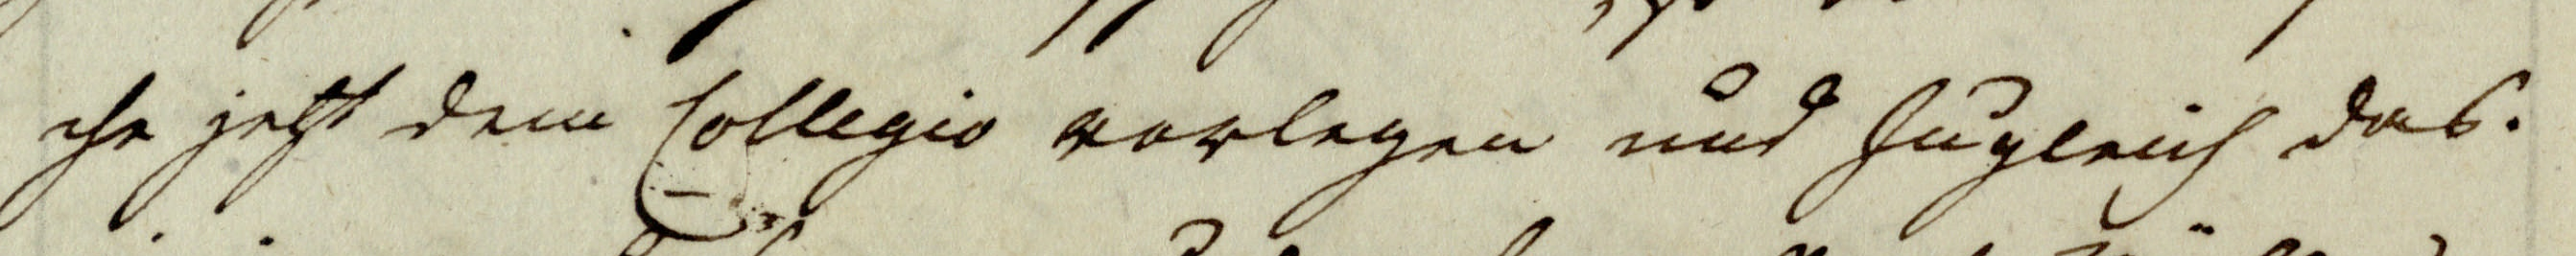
che jetzt dem Collegio vorlegen und zugleich das¬
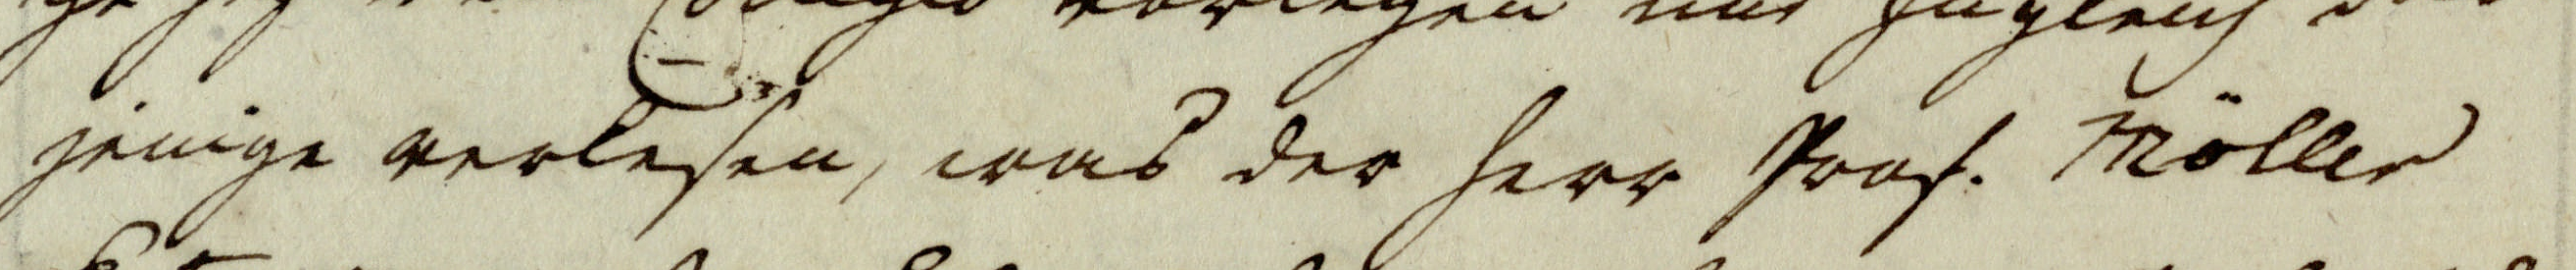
jenige verlesen, was der Herr Prof. Möller
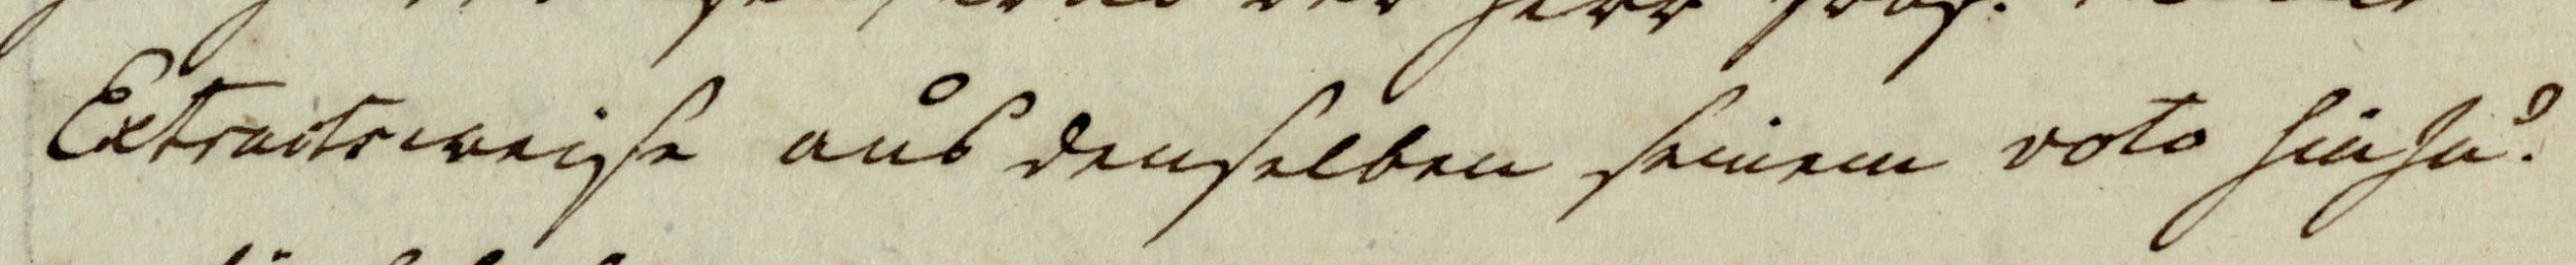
Extractsweise aus denselben seinem voto hinzu¬
